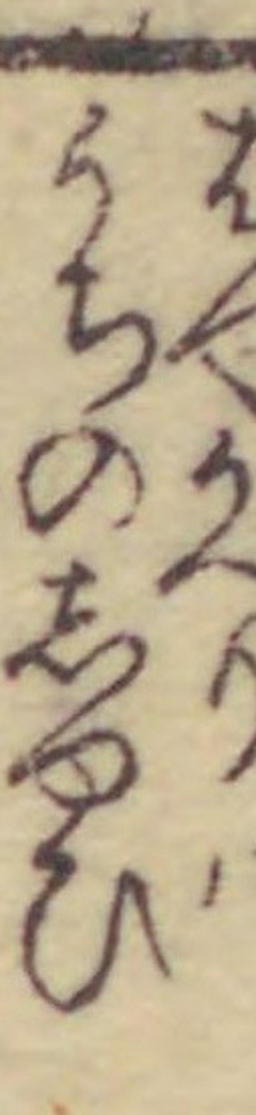うちのしゆひ
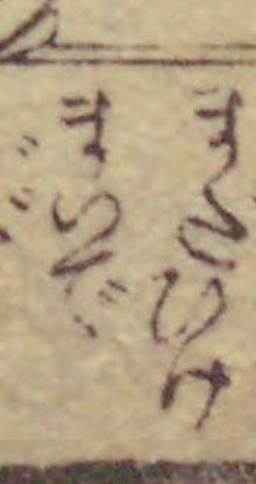まいで
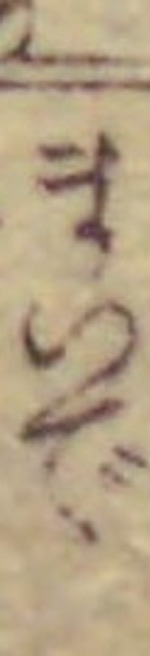まいで
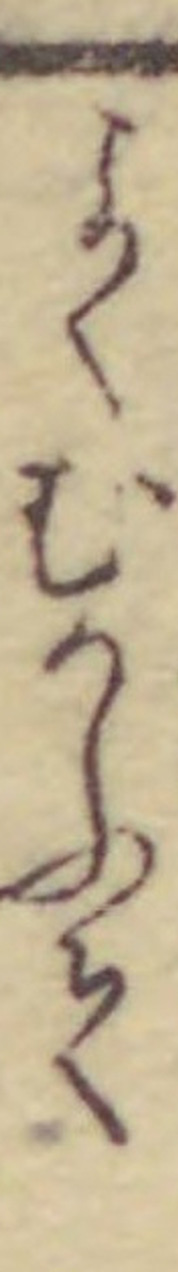よくむかふて
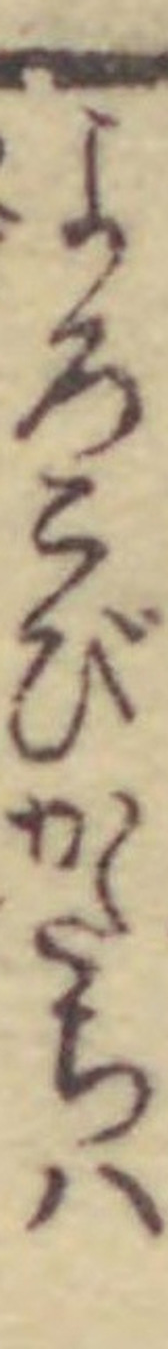よろこびかたちは
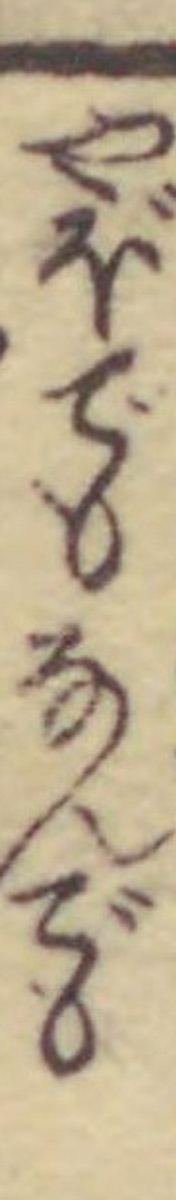やぼでもなんでも
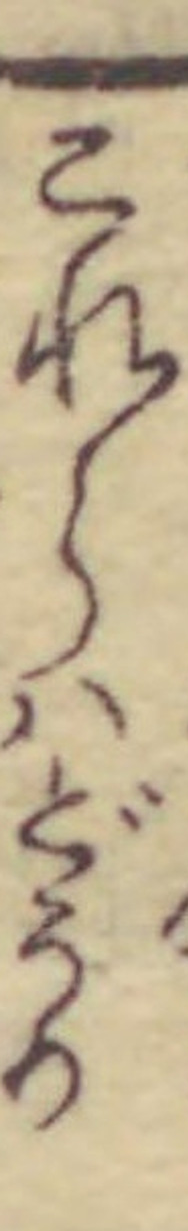これらはどうり
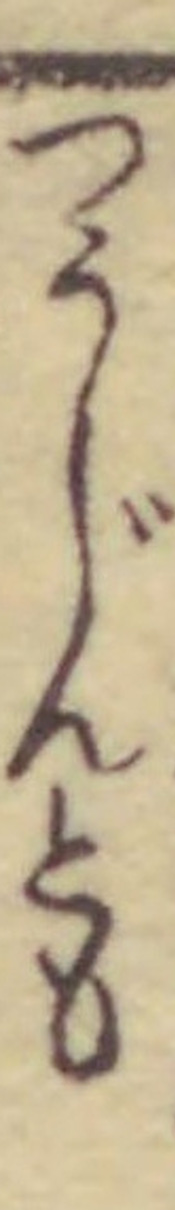つうじんとも
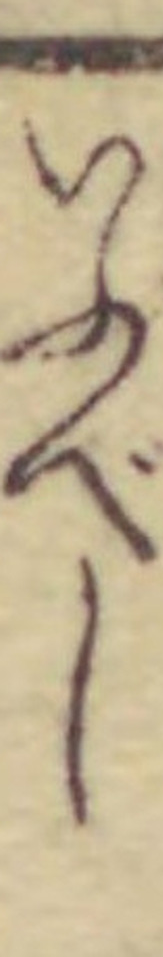いふべし
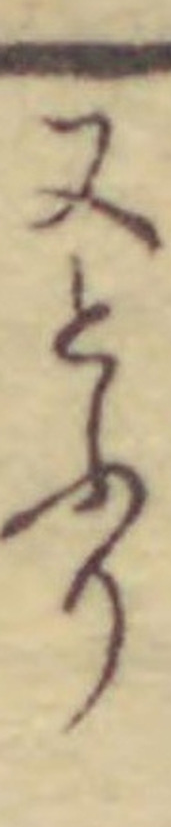又とふり
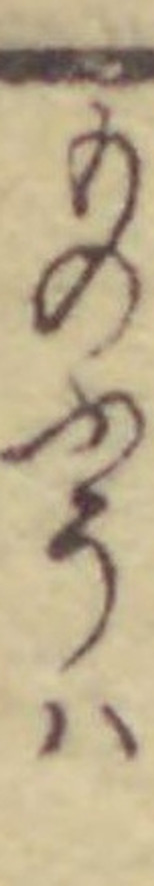ものふうは
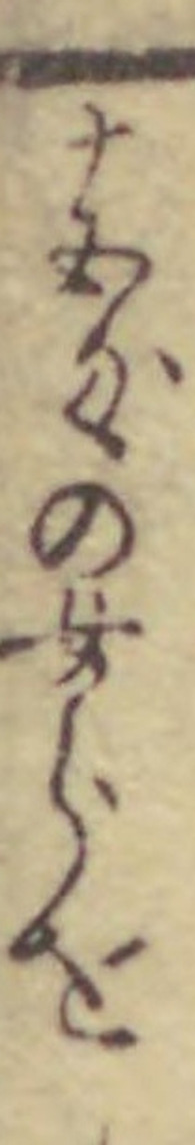十五匁の女郎を
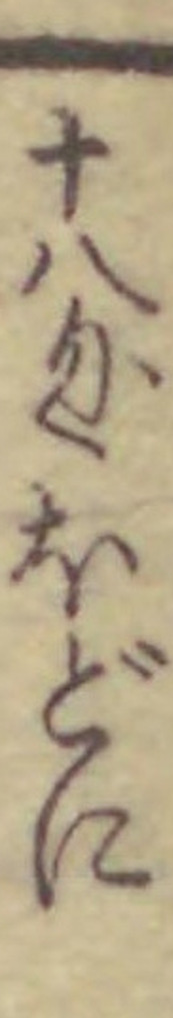十八匁ほどに
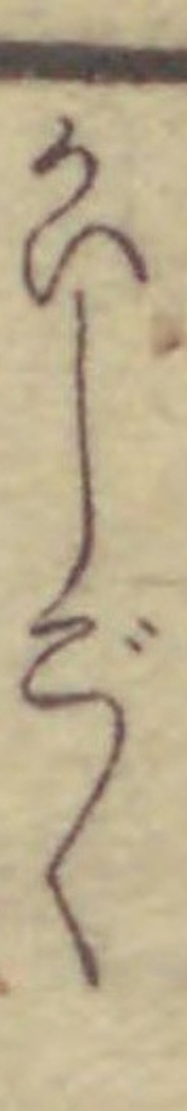かいしごく
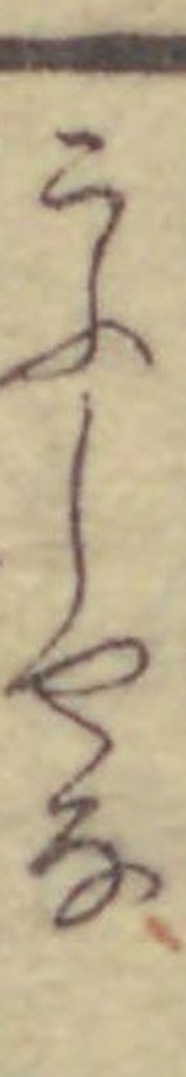こふしやな
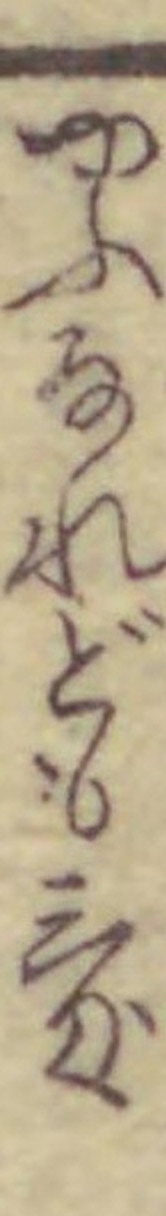やふなれども三匁
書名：大通人穴[サガシ] 3巻
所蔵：国立国会図書館 National Diet Library, JAPAN
